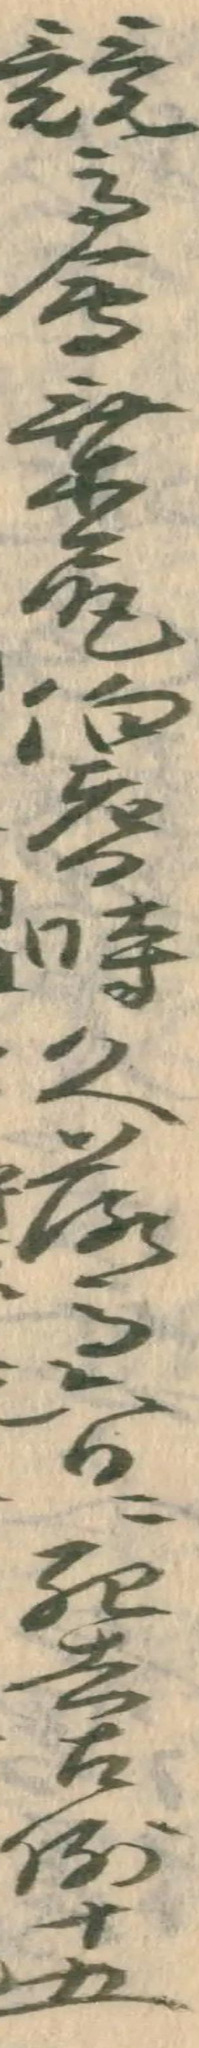競馬会乗尻伯耆時久落馬六日に死去古例十五
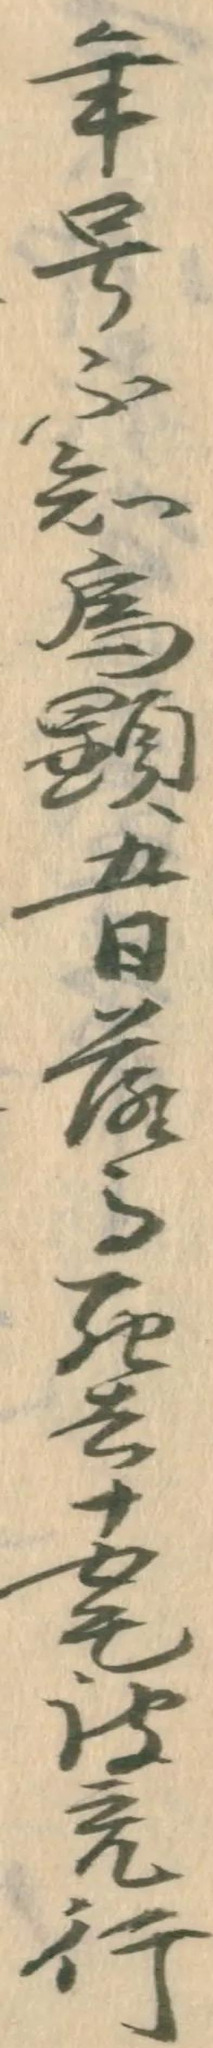年号不知為顕五日落馬死去十五毛被充行
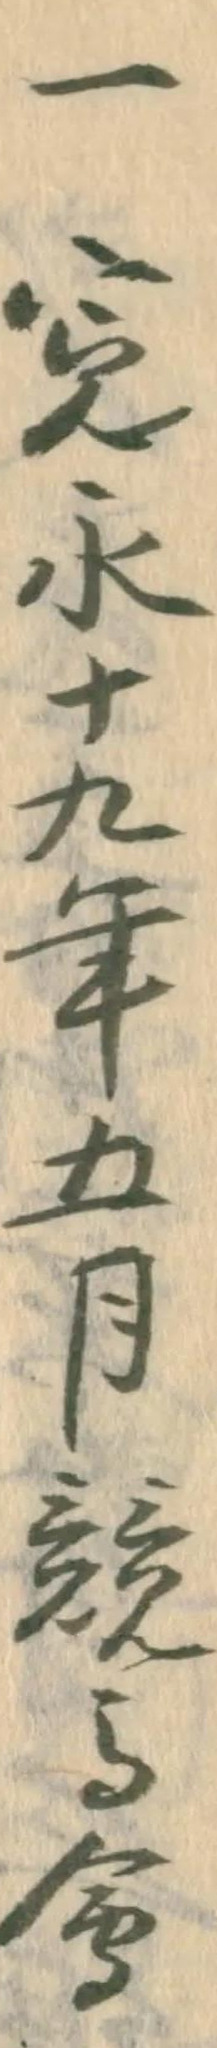一寛永十九年五月競馬会
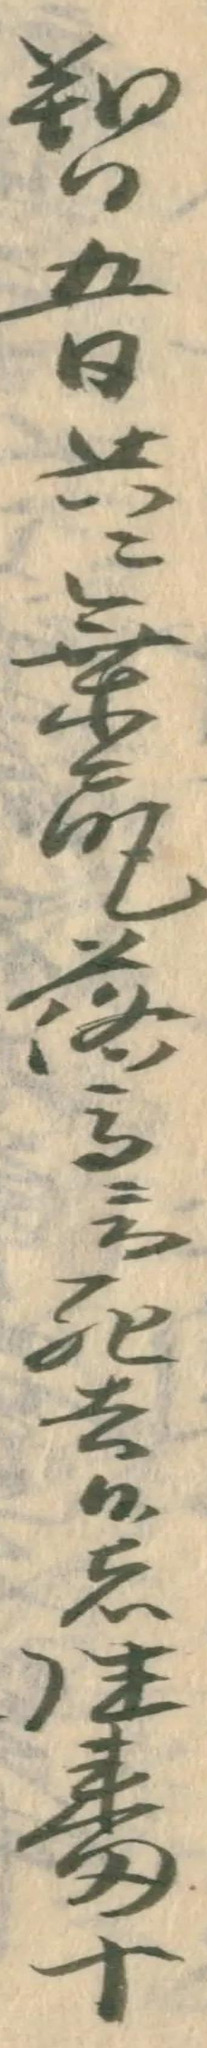朔日五日共ニ乗尻落馬ニ而死去候者住番十
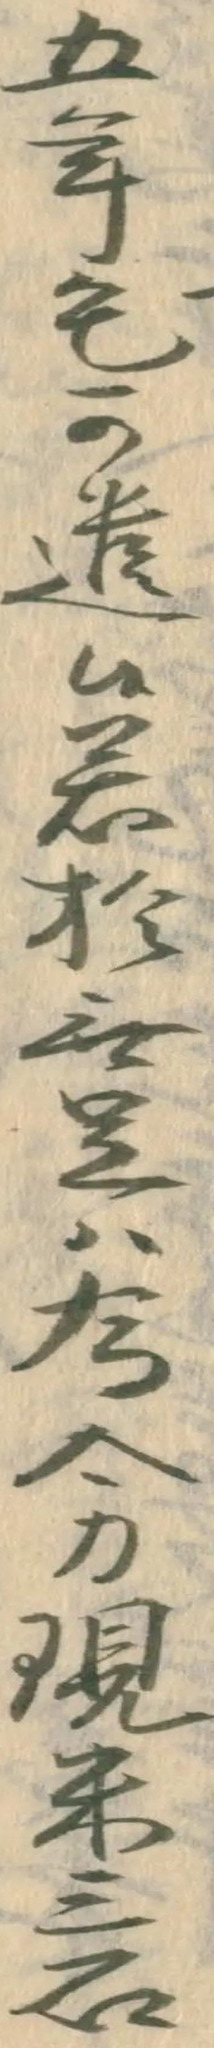五年毛可遣候若於無足ハ為合力現米三石
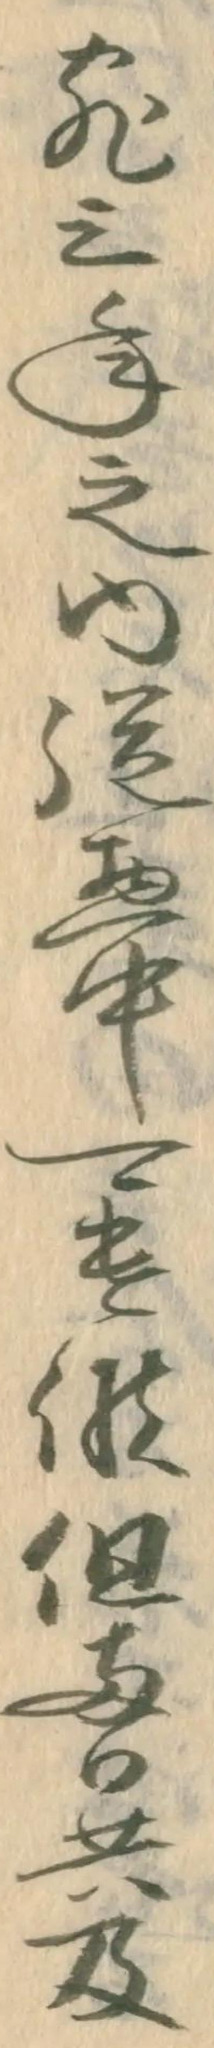宛三年之内従惣中可遣候但両日共及

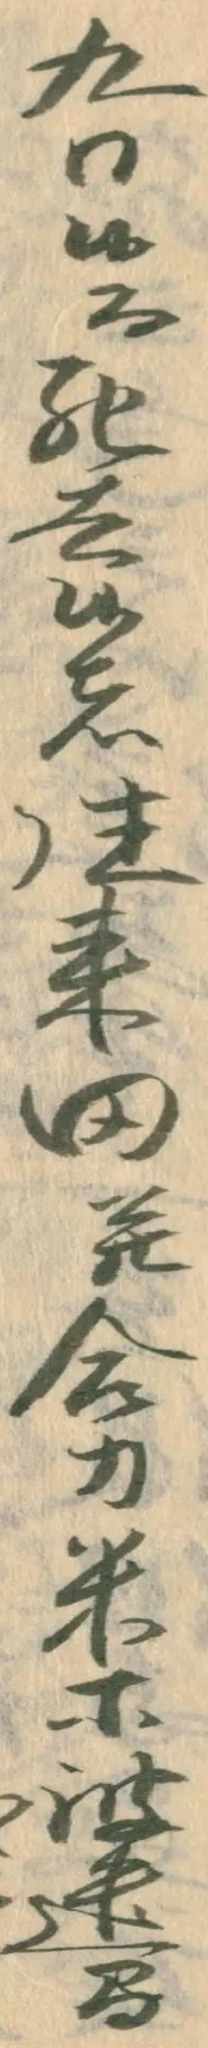九日候而死去候者往来田并合力米等被遣間敷事
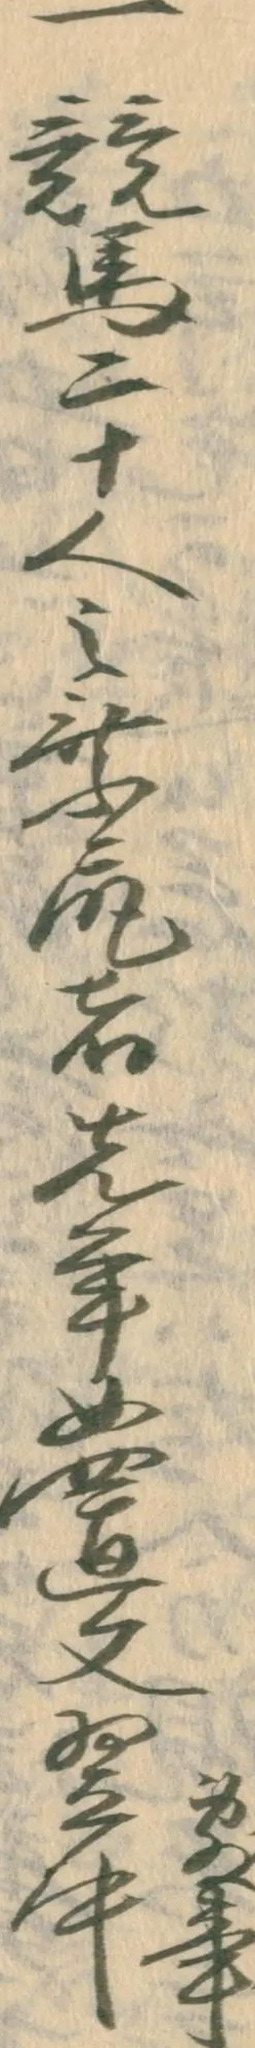一競馬二十人之乗尻者先年如置又翌中
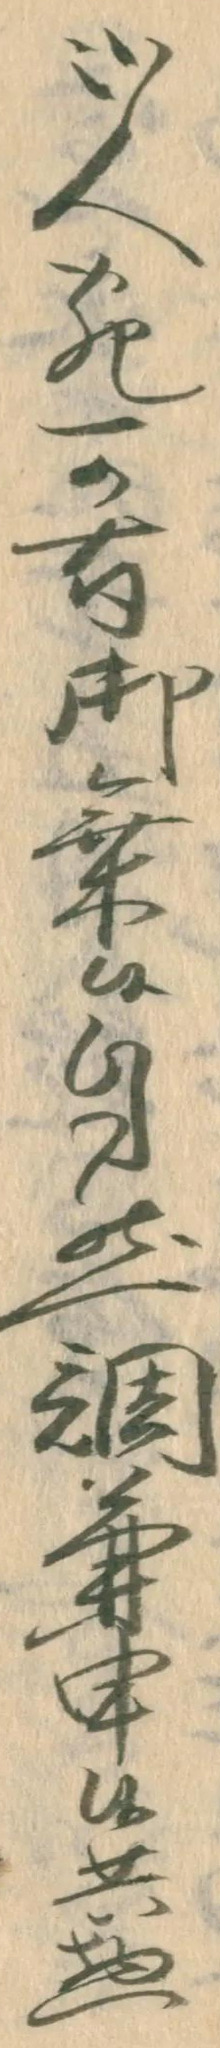弐人宛可有御乗候自然調兼申候共惣
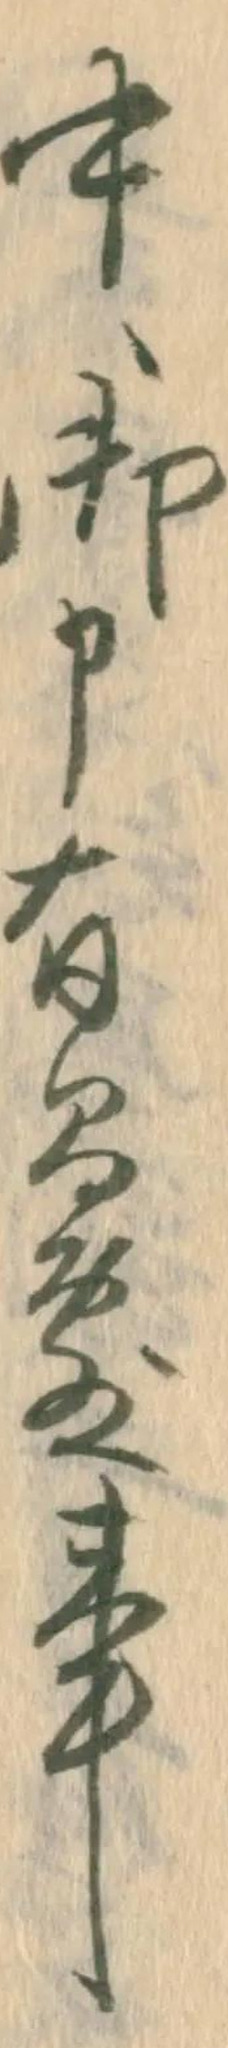中へ御申有間敷事
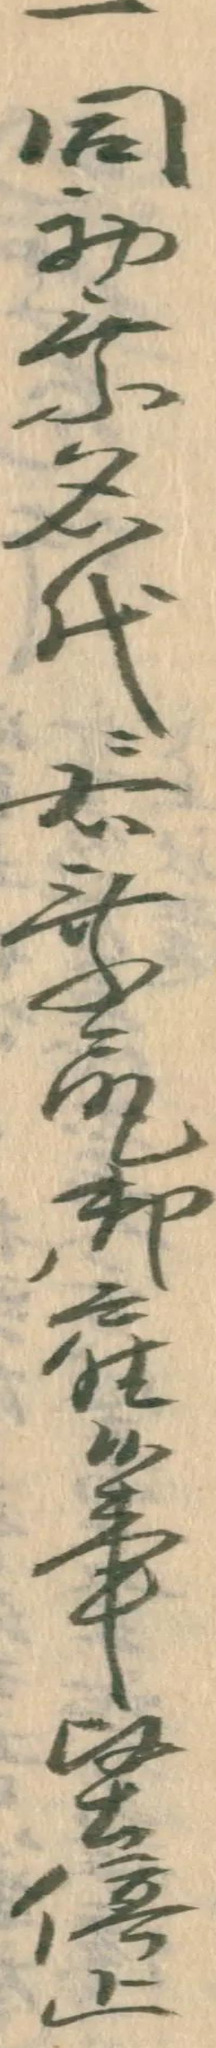一同初乗名代ニ右乗尻御雇候事堅停止
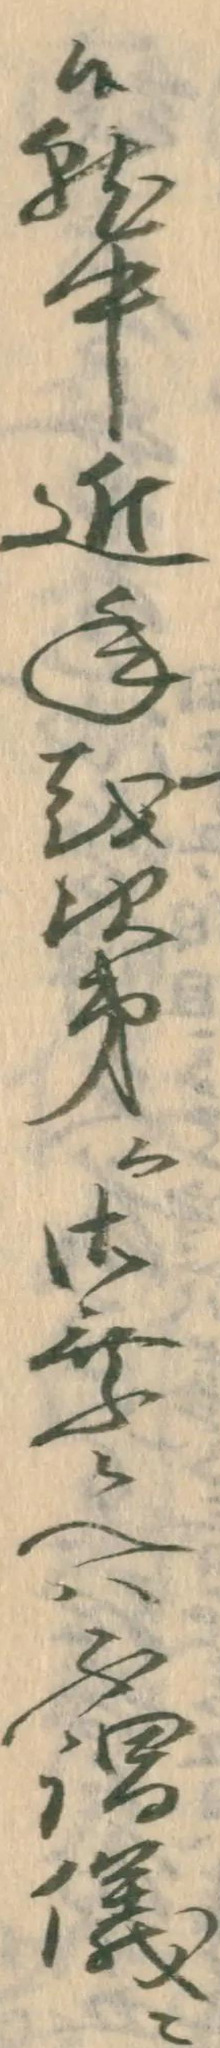候就中近年越次第而御乗候へハ不謂儀ニ
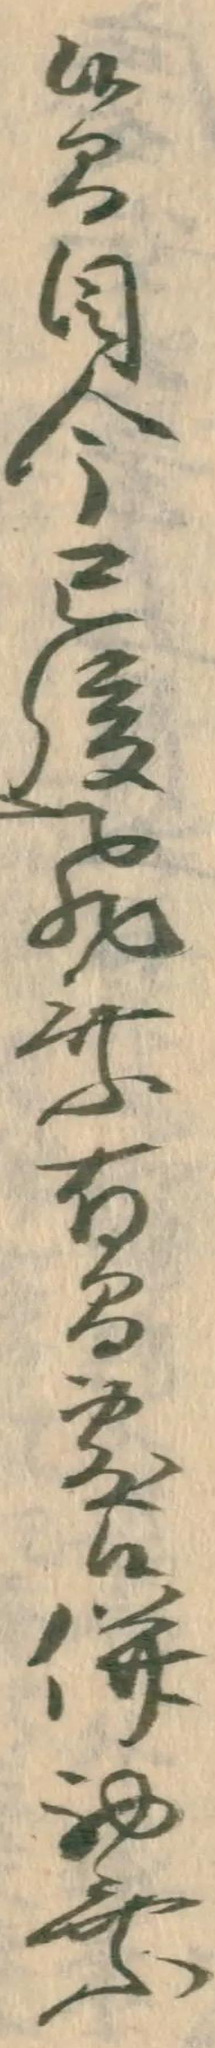候間自今已後飛乗有間敷候併初乗
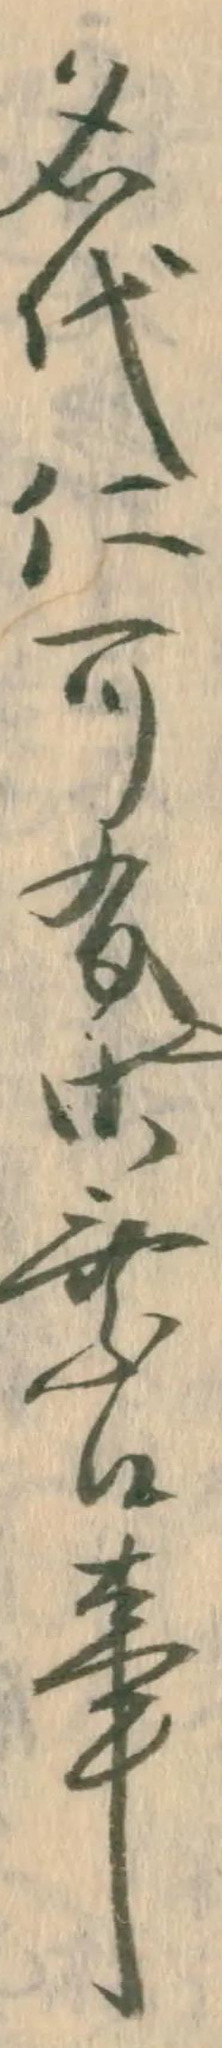名代仁可有御乗候事
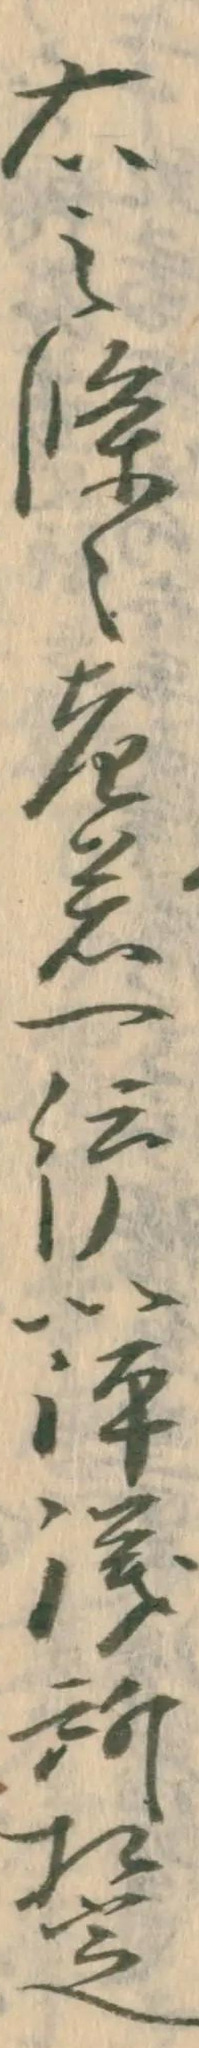右之條々老若一統以評議所相定
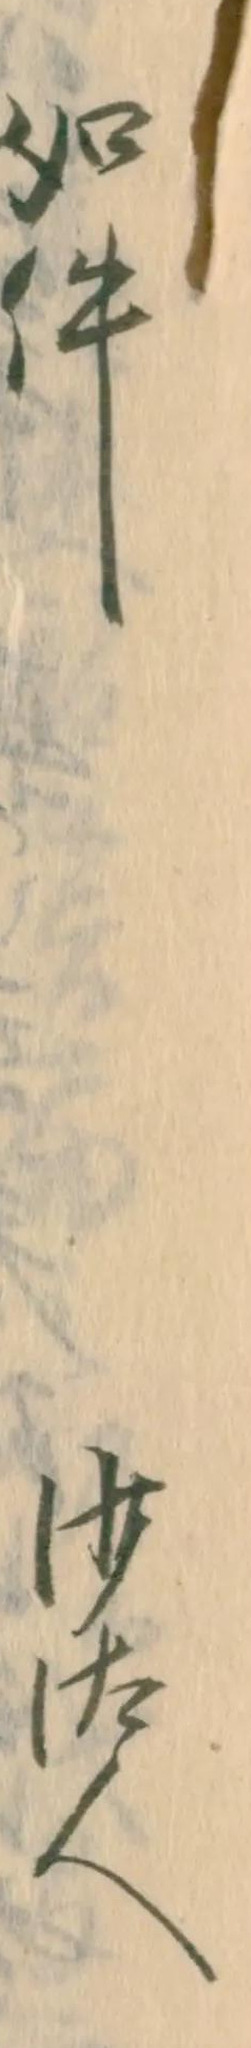如件沙汰人
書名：賀茂社記録. 第12冊
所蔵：国立国会図書館 National Diet Library, JAPAN
